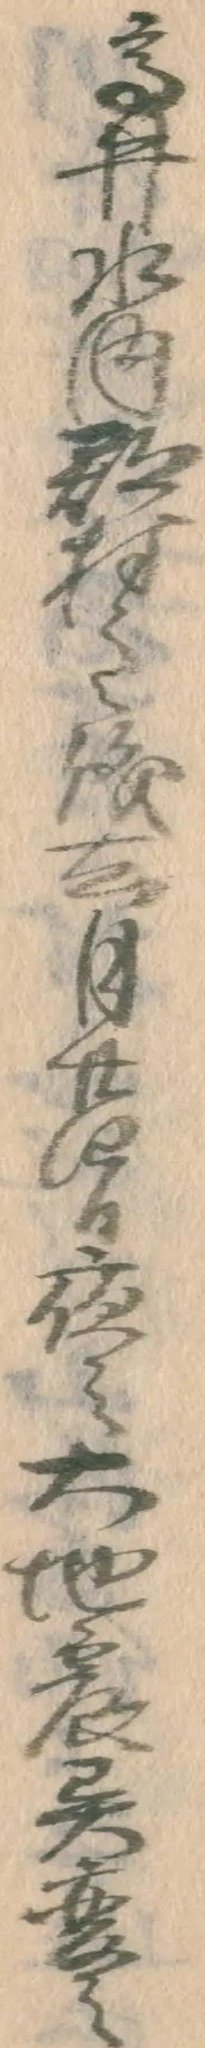高井水内郡村々之儀去月廿四日夜之大地震異変之
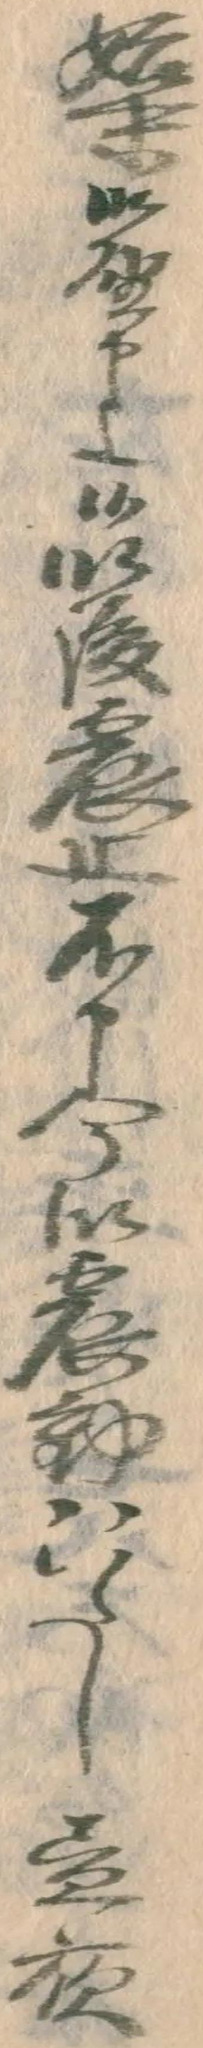始末御届申上候以後震止不申今以震動いたし昼夜
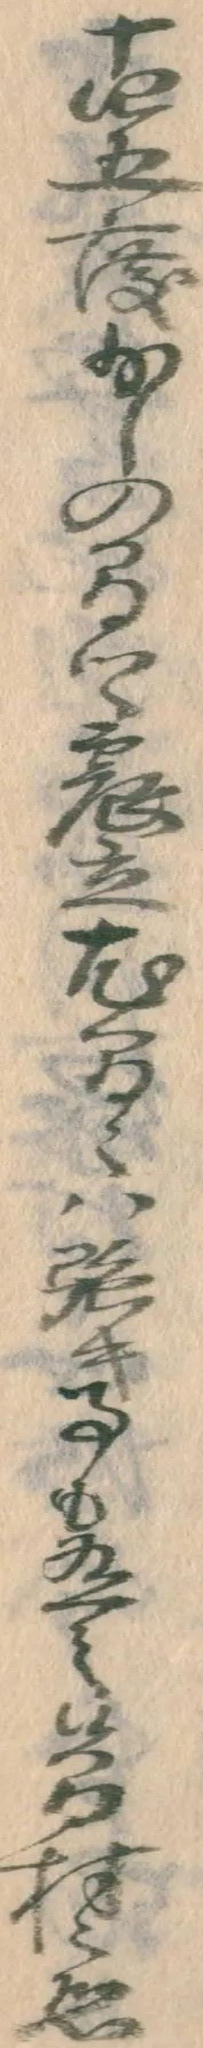十四五度少しの間ツゝ震立尤間々ハ強キ事も有之候間村々ハ恐
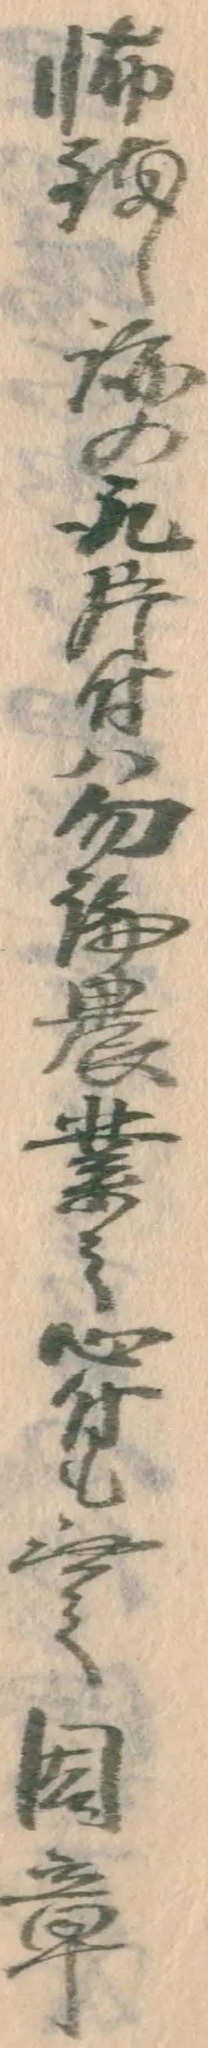怖致し跡所片付ハ勿論農業之心付も無之周章
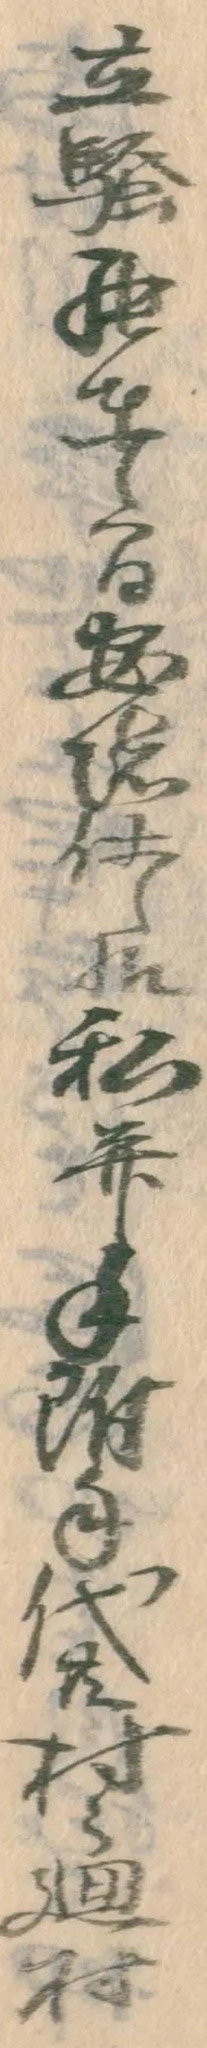立騒罷在候間安堵仕候様私并手附手代共村々廻村
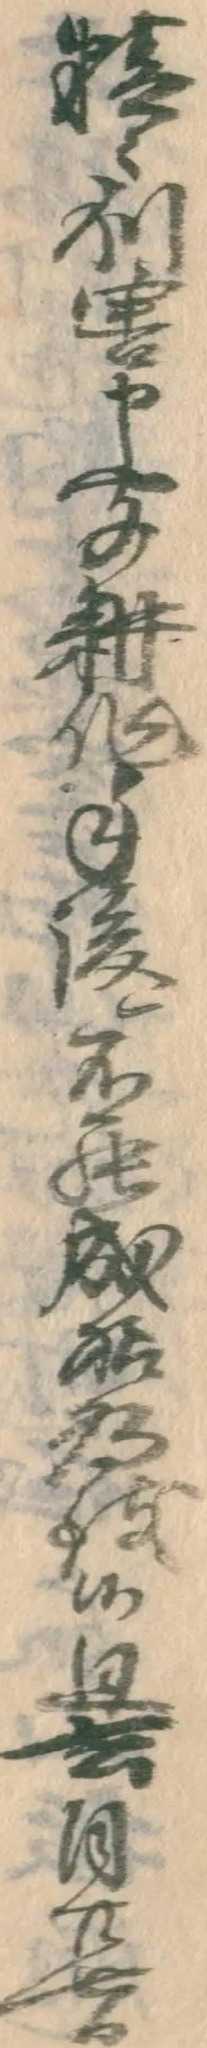精々利害申聞耕作手後ニ不罷成様可致候且去月廿七日
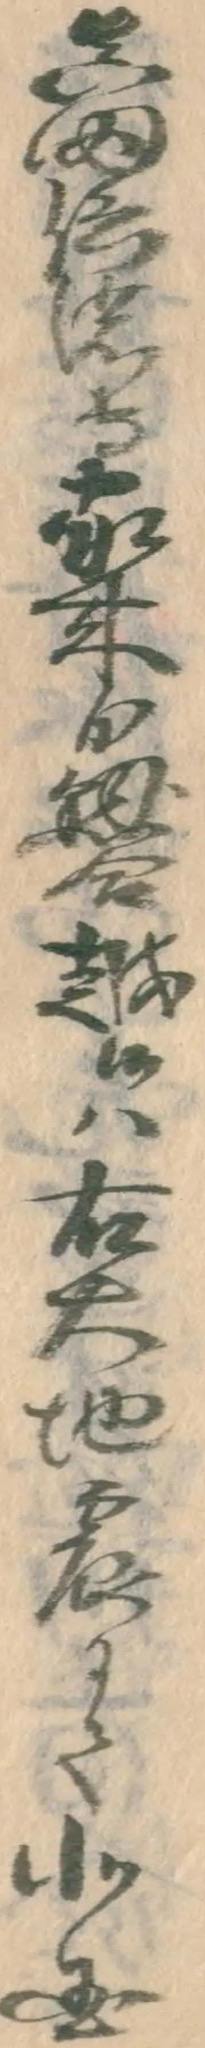真田信濃守家来ゟ懸合越候ハ右地震にて北国

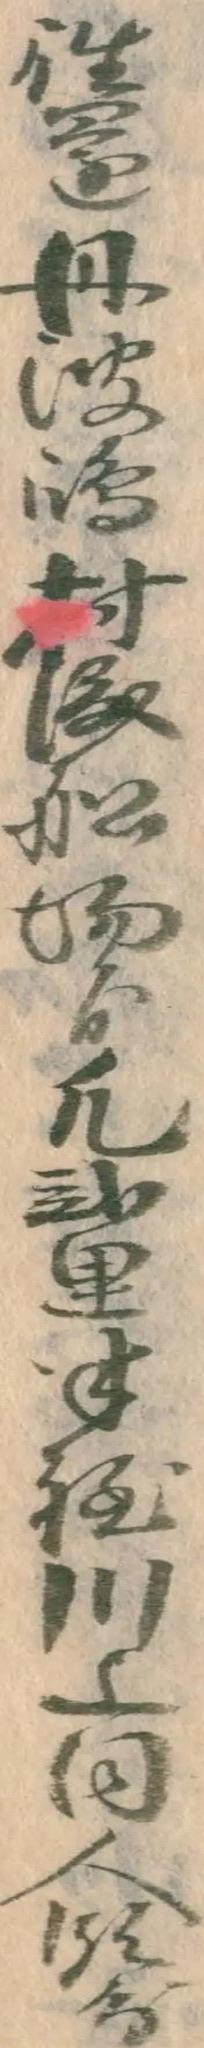往還丹波島宿渡船場ゟ凡弐里半程川上同人領分
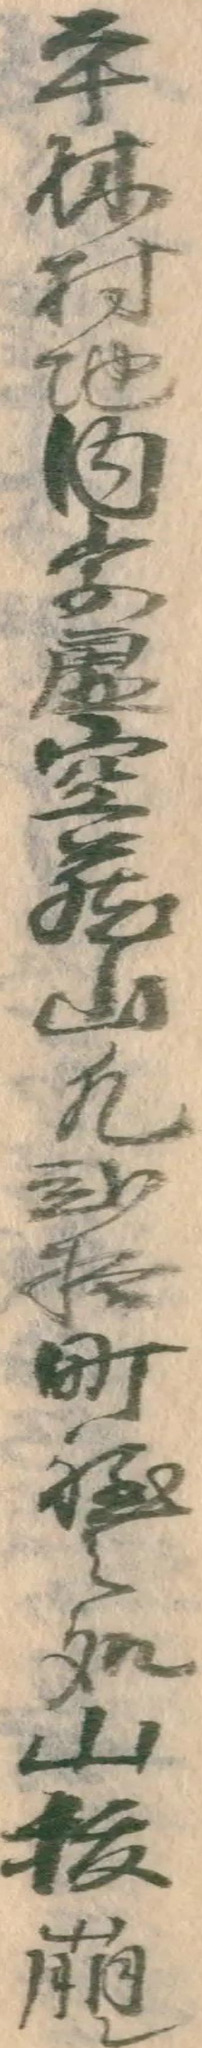平林村地内字虚空蔵山凡弐拾町程之処山抜崩レ
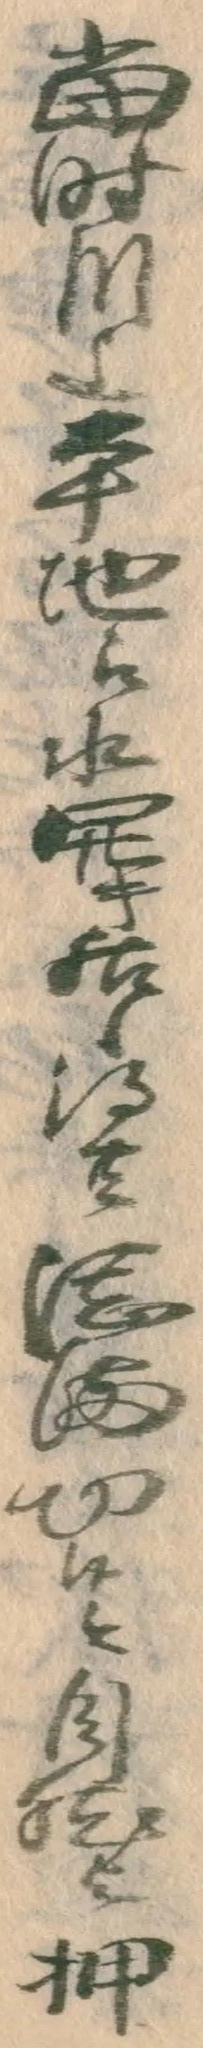当時川上平地江水開異候得共湛溜切候と自然と押
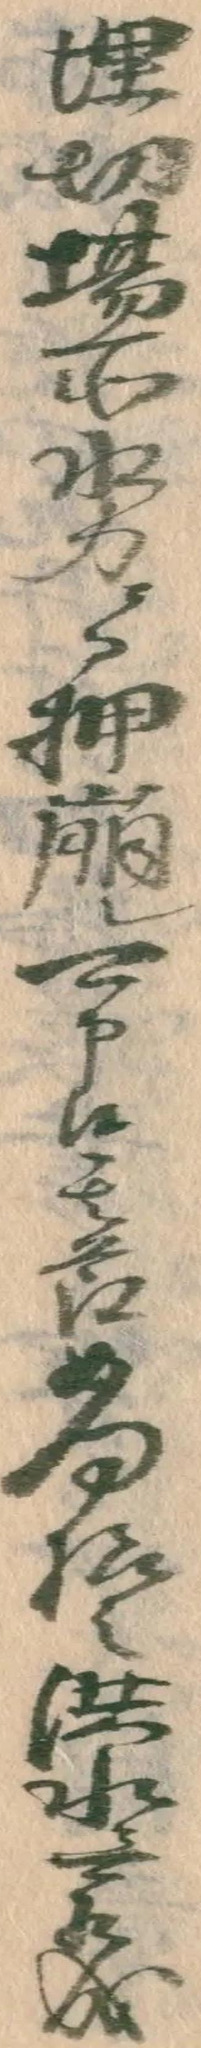埋切場所水力ニ而押崩レ可申候其節如何様之洪水可相成
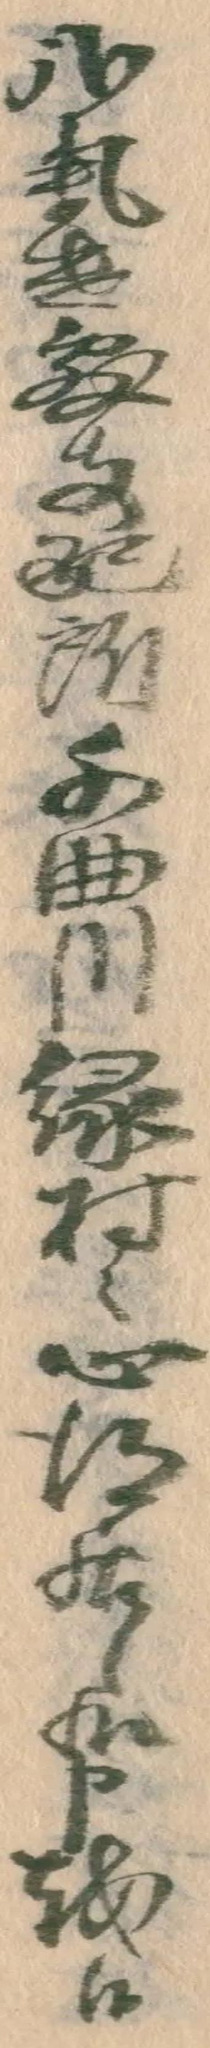哉気遣敷支配所千曲川縁村々心得置候様申越候
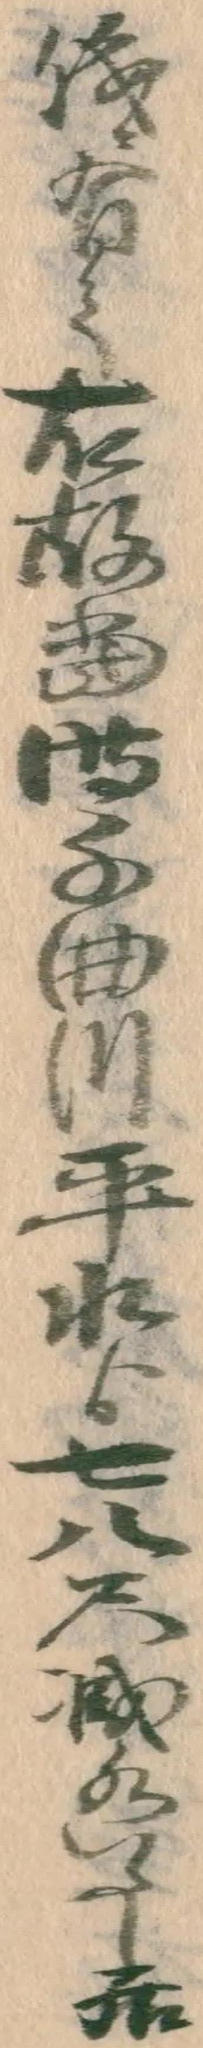儀二有之右故当時千曲川平水ゟ七八尺減水いたし居
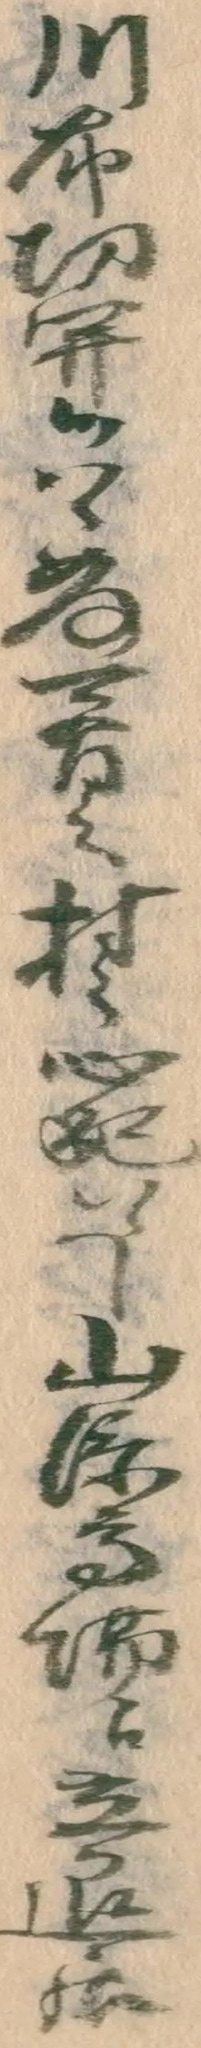川筋切開候ハゝ如何可有之村々心配致シ山添高場江立退居
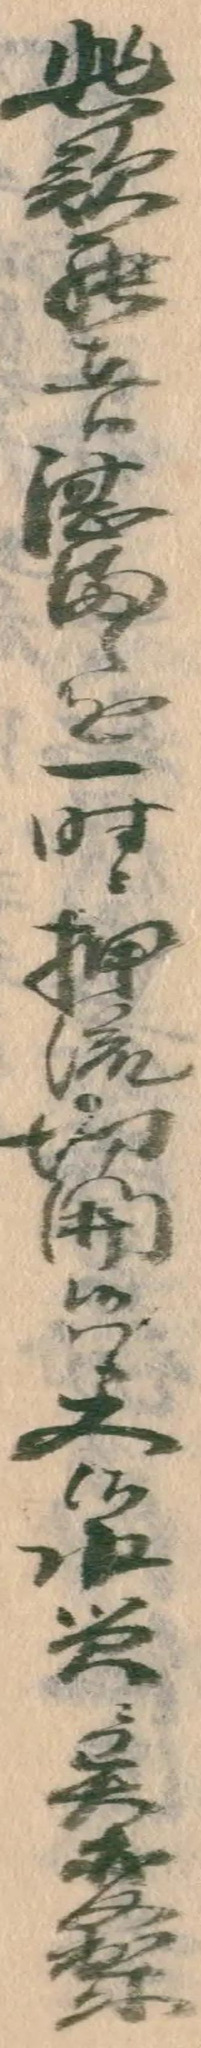悲歎罷在候湛溜を一時二押流切開候ハヽ又候水災二異変又出来
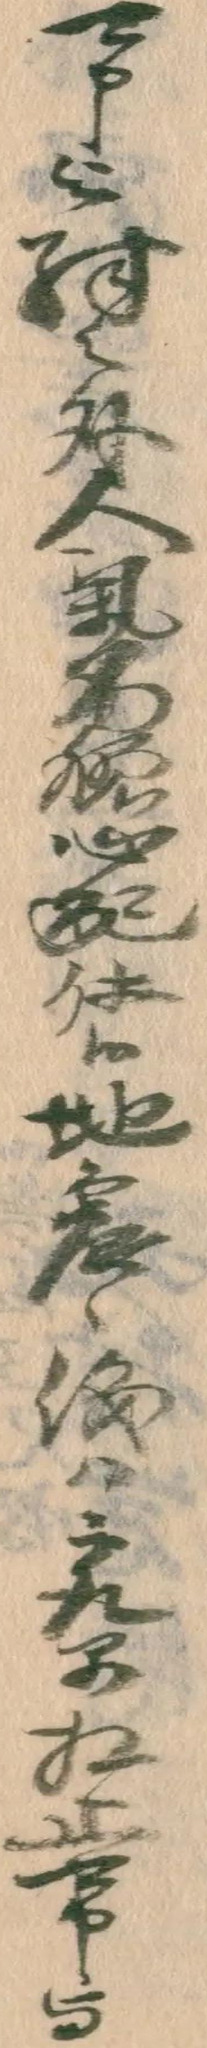可申と殊之外人気不穏心配仕候地震之儀は最早相止可申と
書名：信州大地震之記
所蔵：国立国会図書館 National Diet Library, JAPAN
